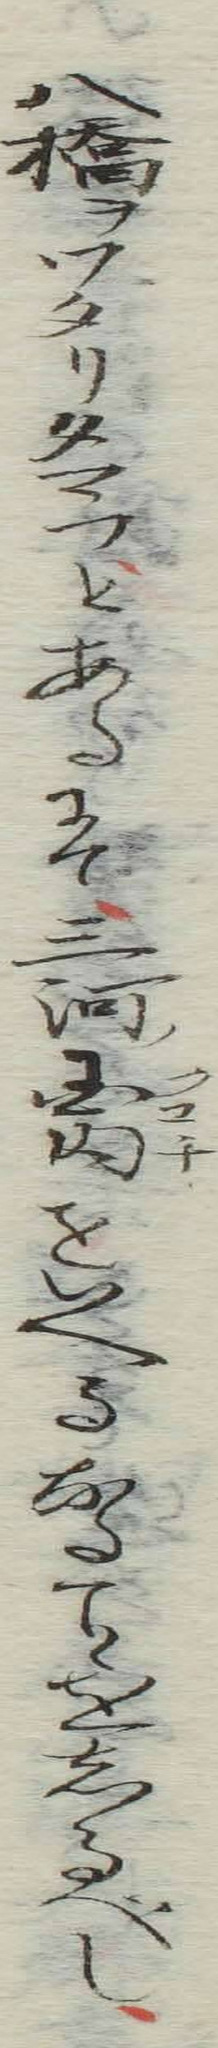八橋ヲワタリタマフとあるにて、三河国内をいへるなることをしるべし、
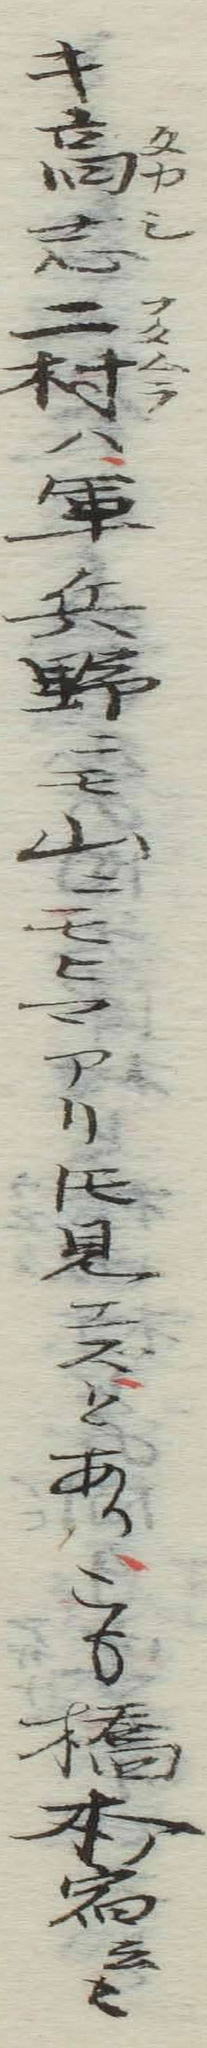キ高志二村は軍兵野ニモ山ニモヒマアリトモ見エズ、とあり、こも橋本宿云々
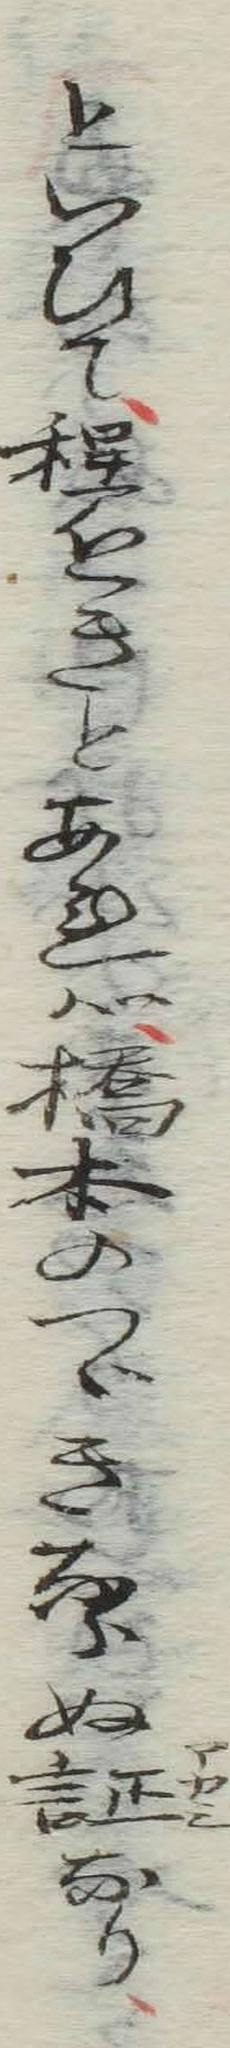といひて、程近きとあれば、橋本のつゞきならぬ証なり、
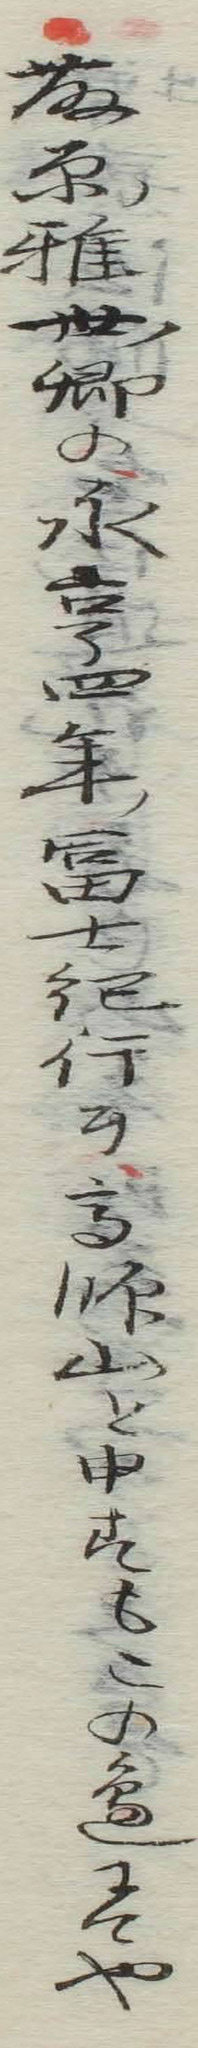●藤原雅世卿の永享四年富士紀行に、高師山と申すもこの辺にてや
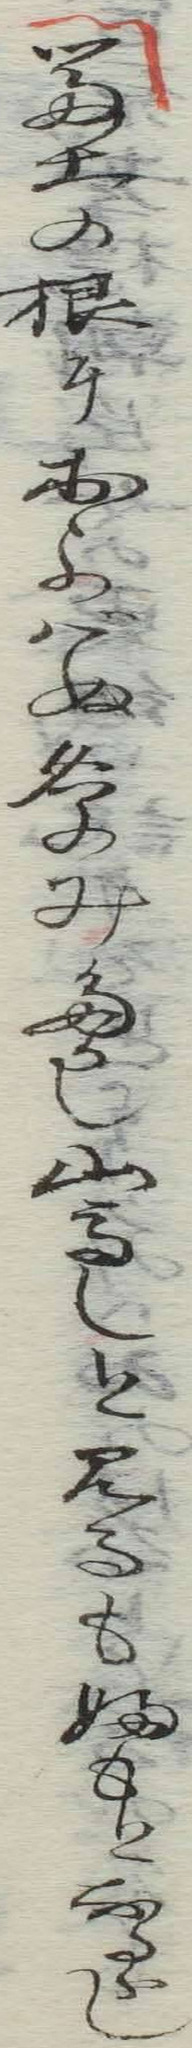〽富士の根におよばぬ名のみたかし山高しと見るもふもとなるらし
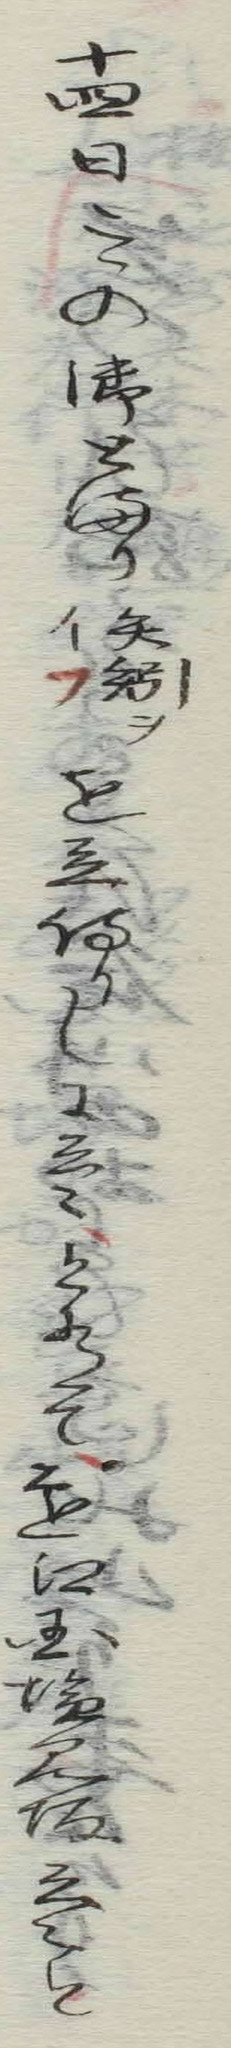十四日こゝの御とまり矢矧ヲイフを立侍りしに云々、と有て、遠江国塩見坂云々と
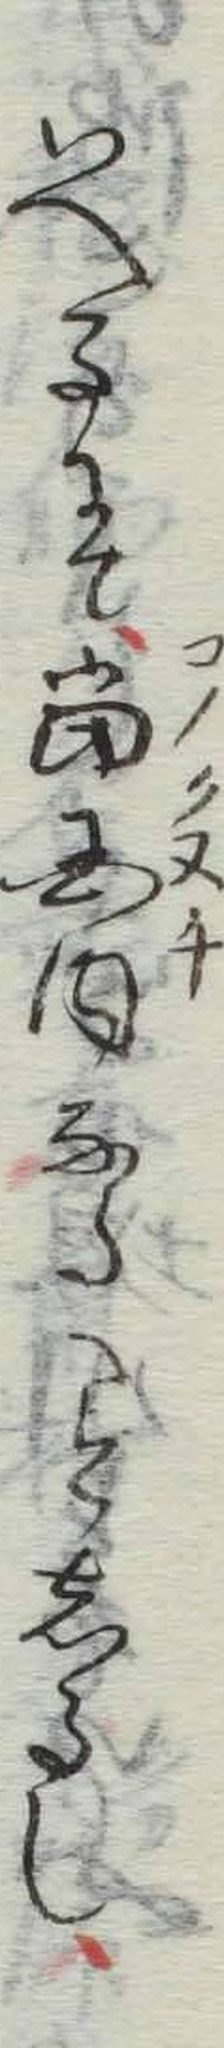いへるにて、当国内なることしるし、
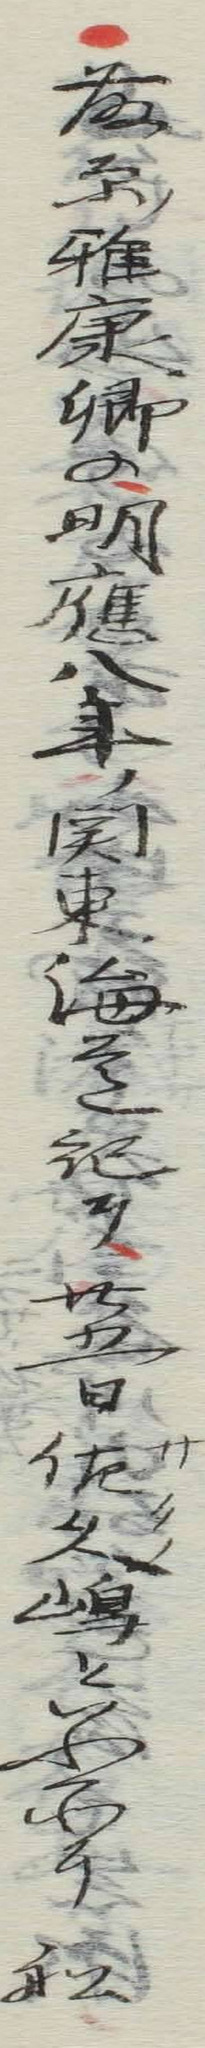●藤原雅康卿の、明応八年関東海道記に、廿五日佐久嶋といふ所に船
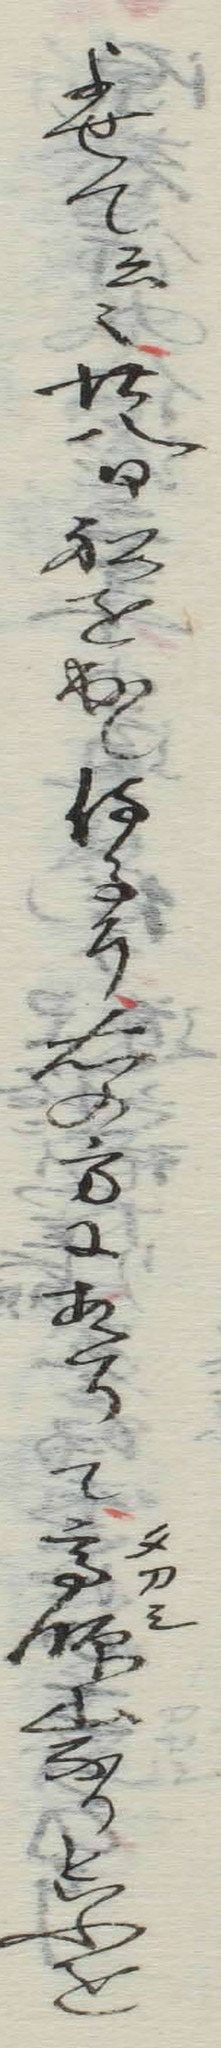よせて云々、廿八日船を出し侍るに、右の方にあたりて、高師山なりといふを
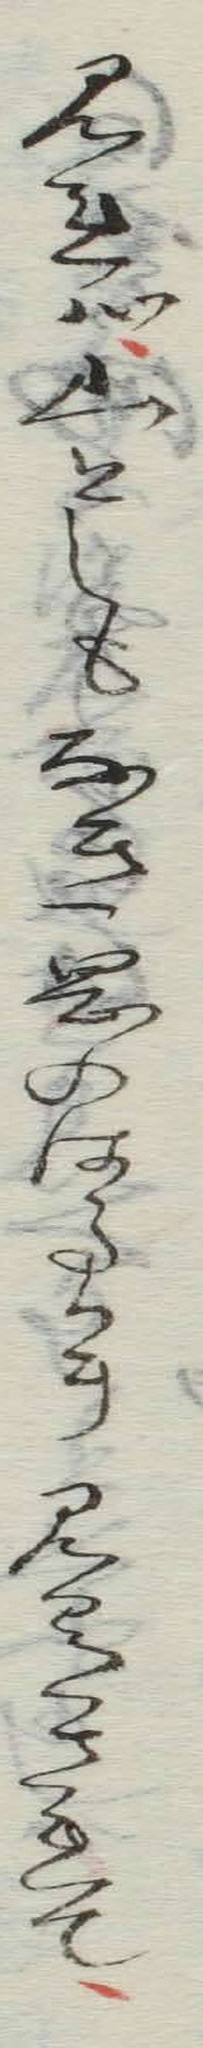見れば、山としもなき岡のはるかに見わたされて、
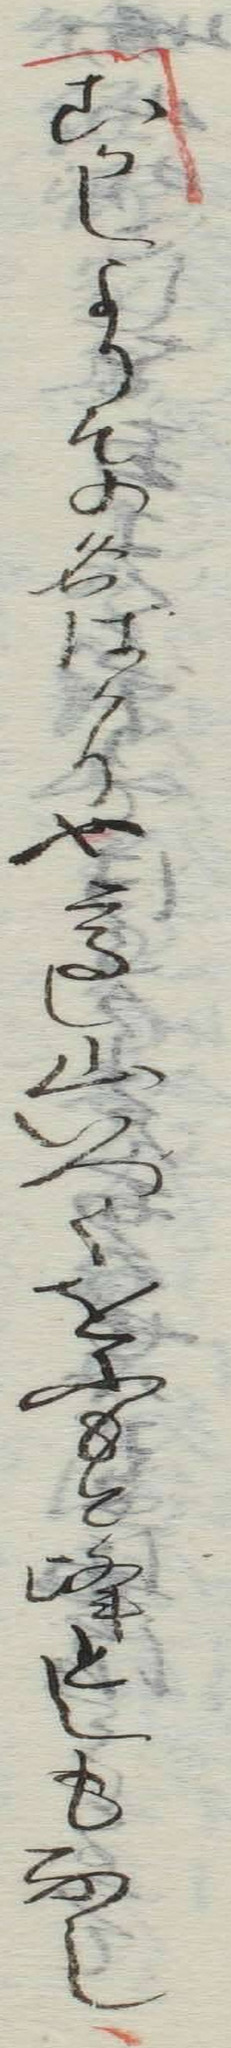〽むかしよりその名ばかりや高し山いつくをふもと峰としもなし、
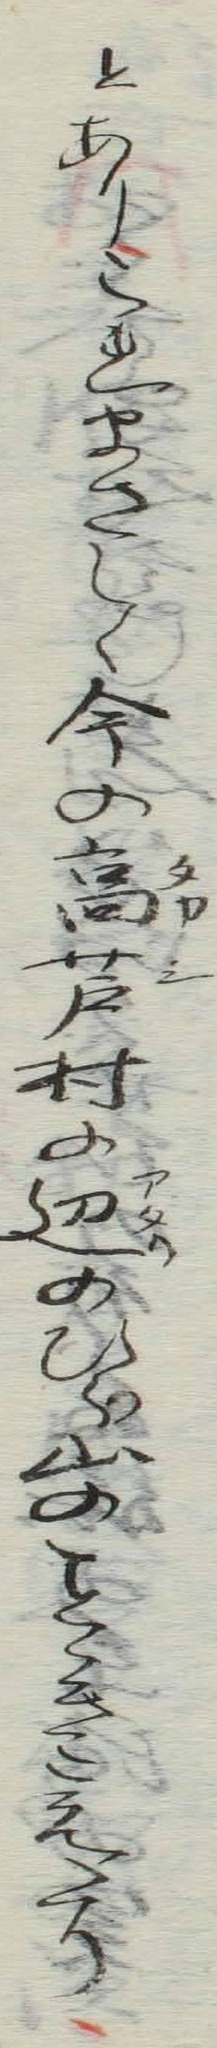とあり、これまさしく今の高芦村の辺のひら山のことゝきこえたり、
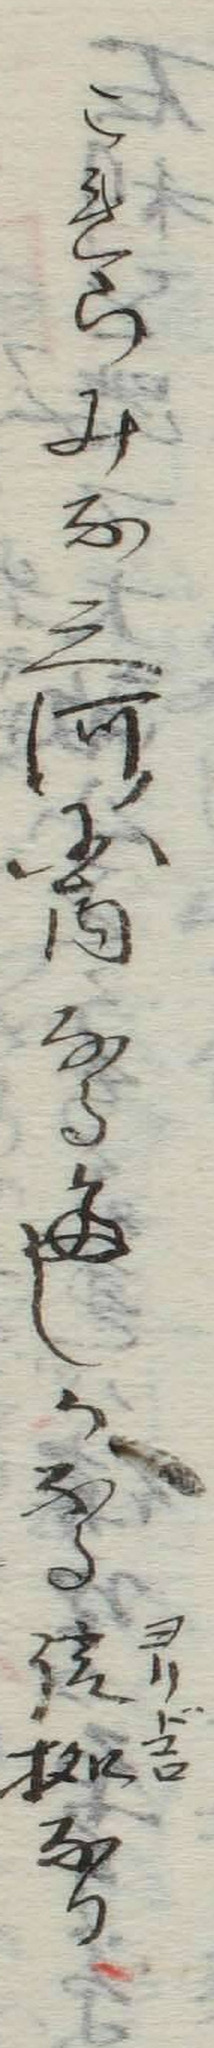これらみな三河国内なるたしかなる証拠なり、

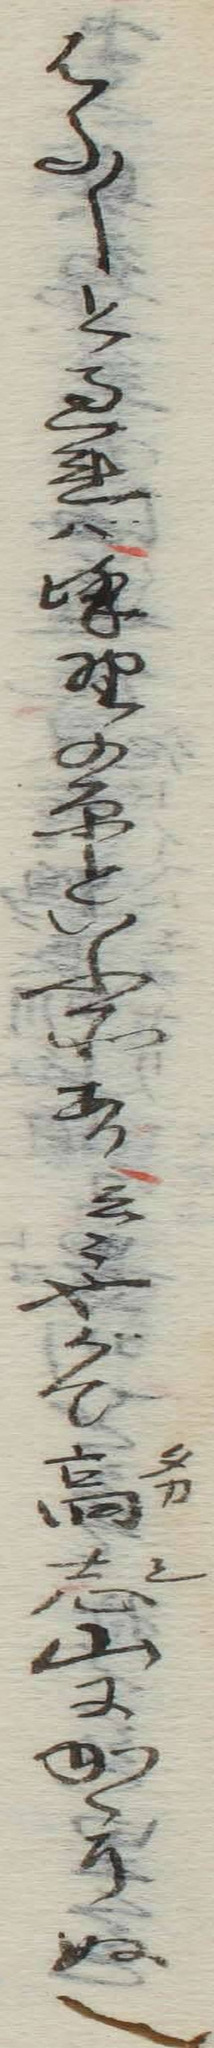はる〳〵と過れば、峰野の原といふ所あり、云々やがて高志山にかゝにぬ
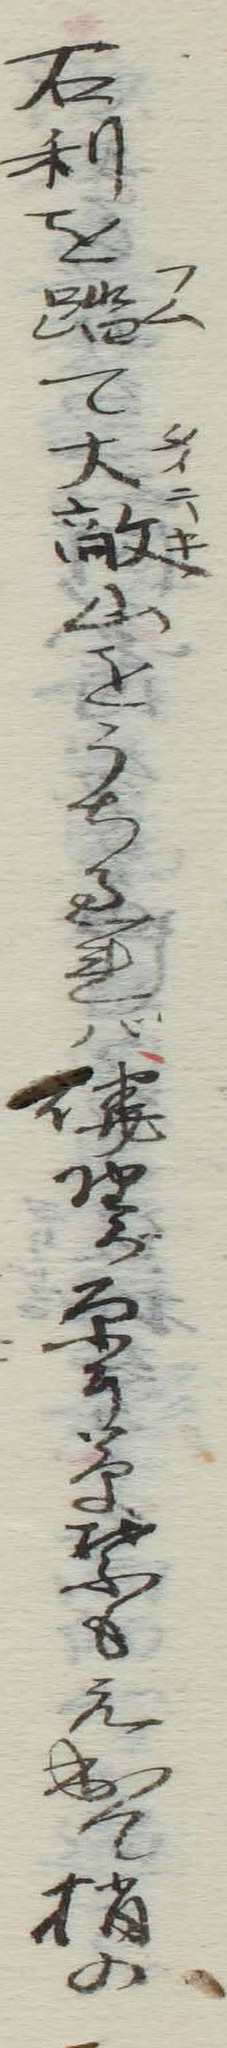石利を踏て大敵山をうち過れば、焼野が原に草葉もえ出て梢の
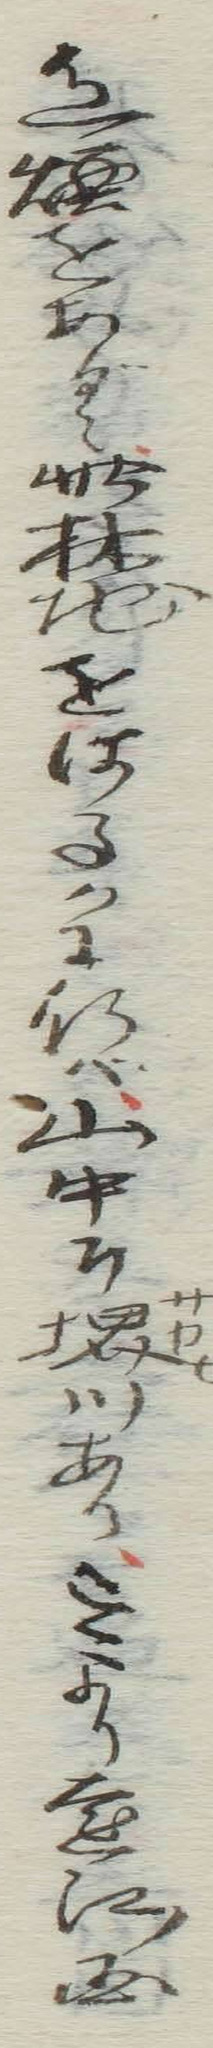色煙をあぐ、此林地をはるかに行ば、山中に堺川あり、こゝより遠江国
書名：三河国古跡考
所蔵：国文学研究資料館
